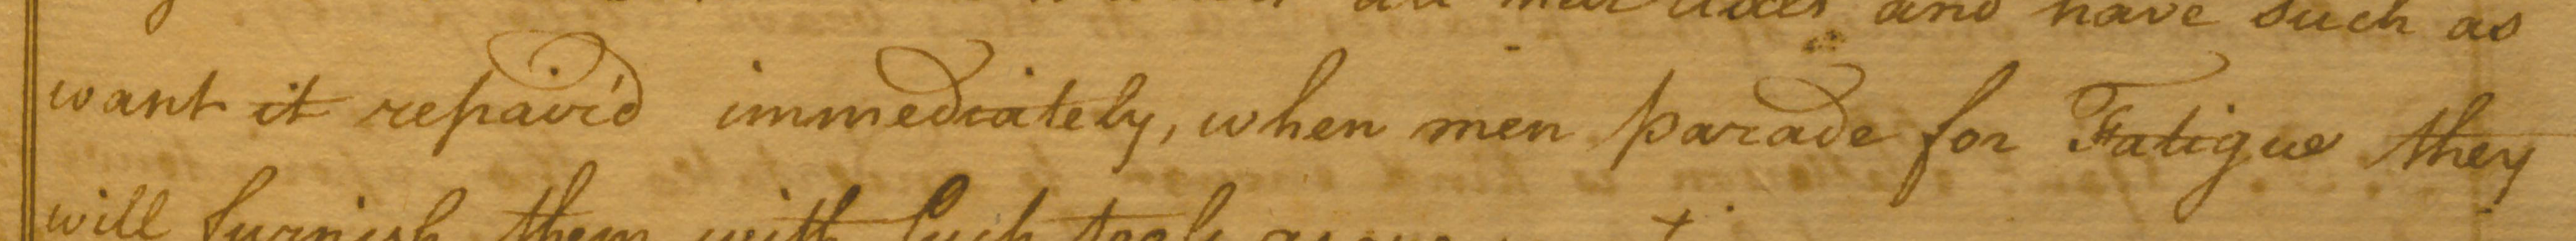want it repair'd immediately, when men parade for Fatigue they
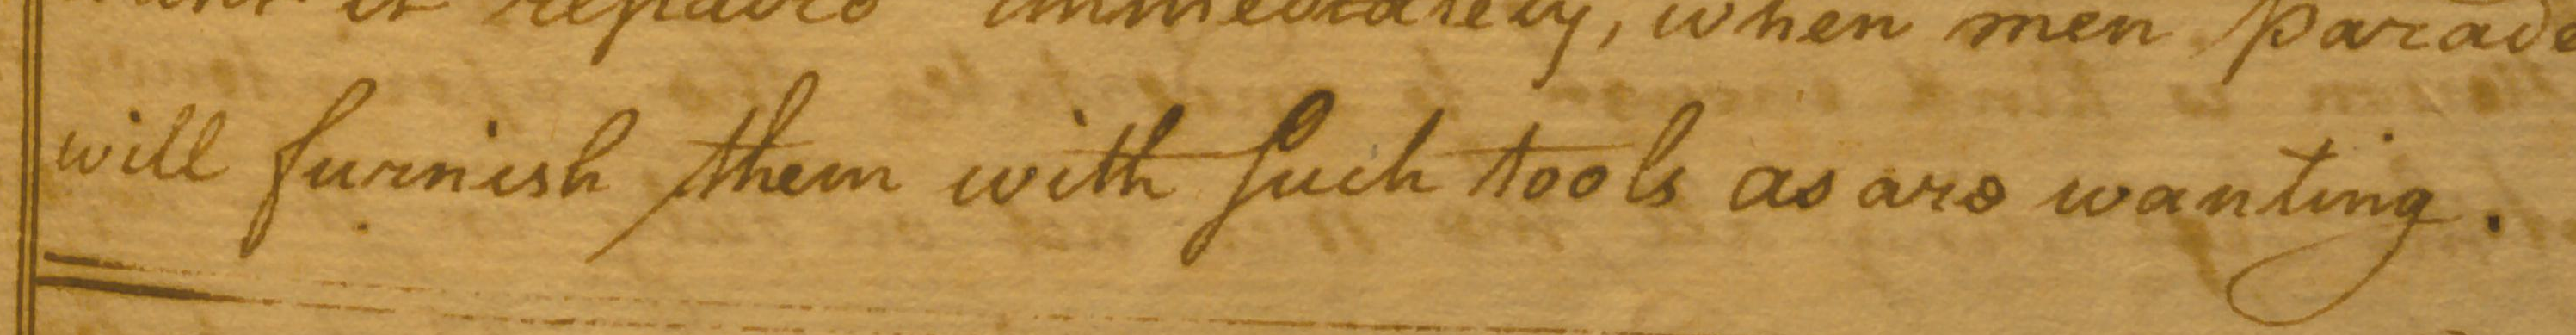will furnish them with such tools as are wanting.
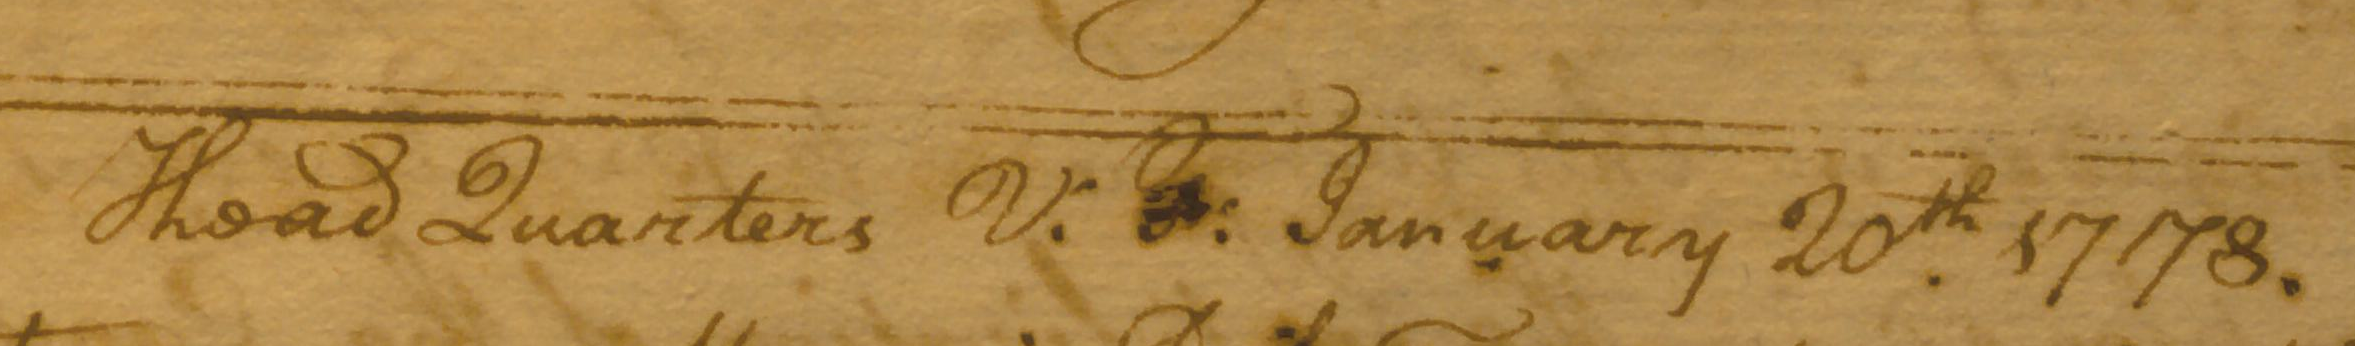Head Quarters V: F: January 20^th. 1778.
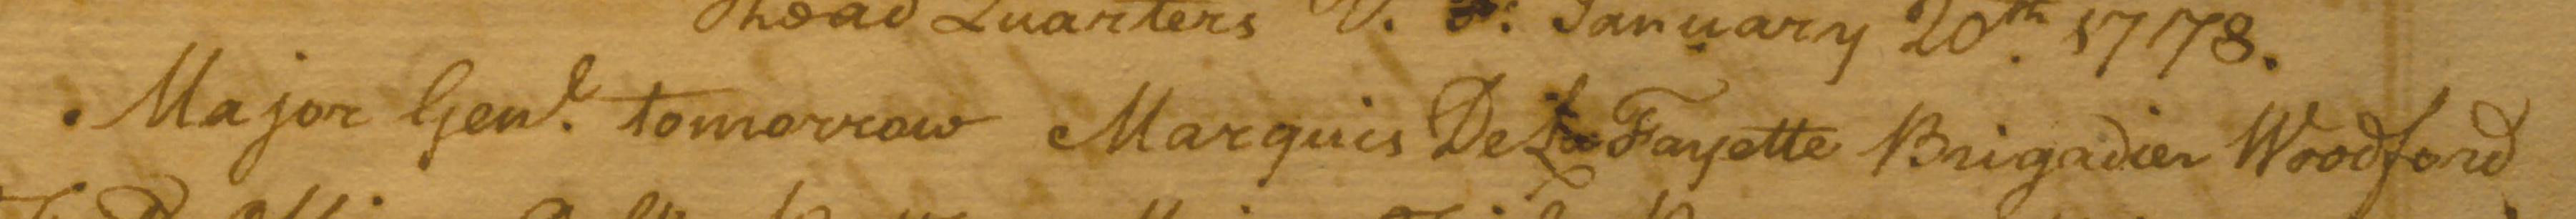Major Gen^l. tomorrow Marquis De La Fayette Brigadier Woodford
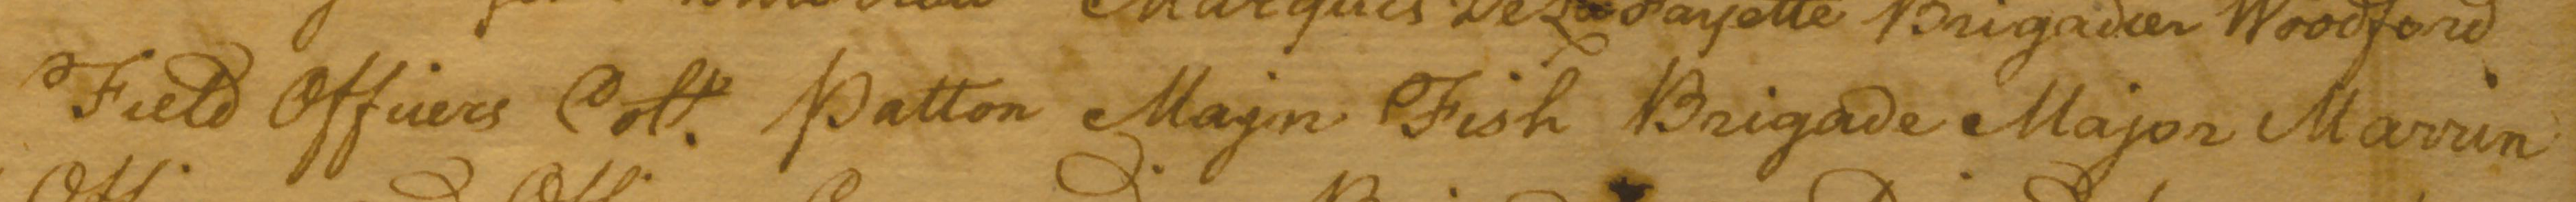Field Officers Col^o. Patton Major Fish Brigade Major Marrin
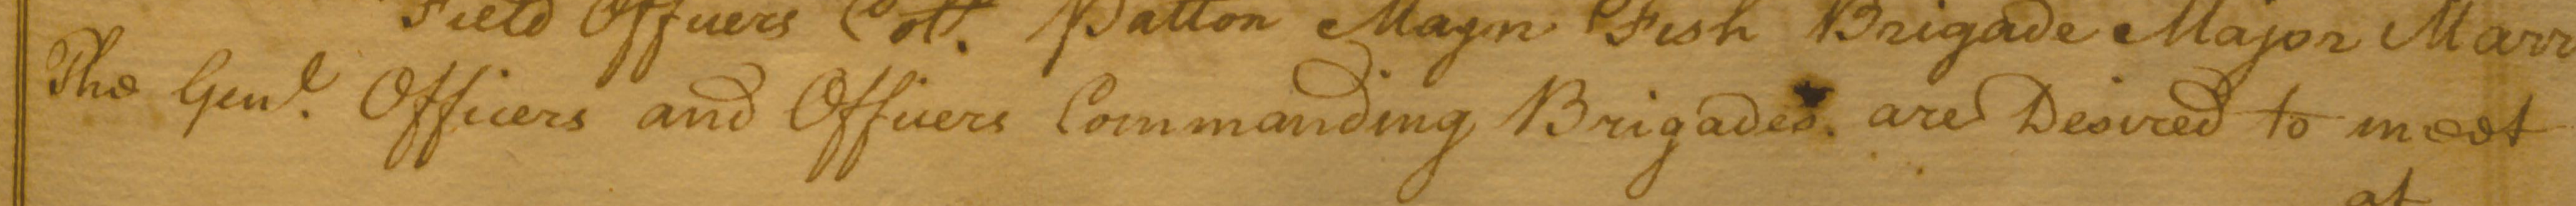The General Officers and Officers Commanding Brigades are Desired to meet
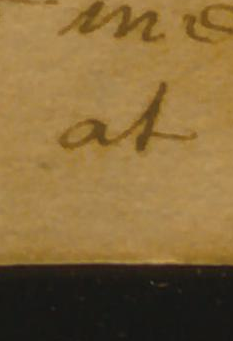at
